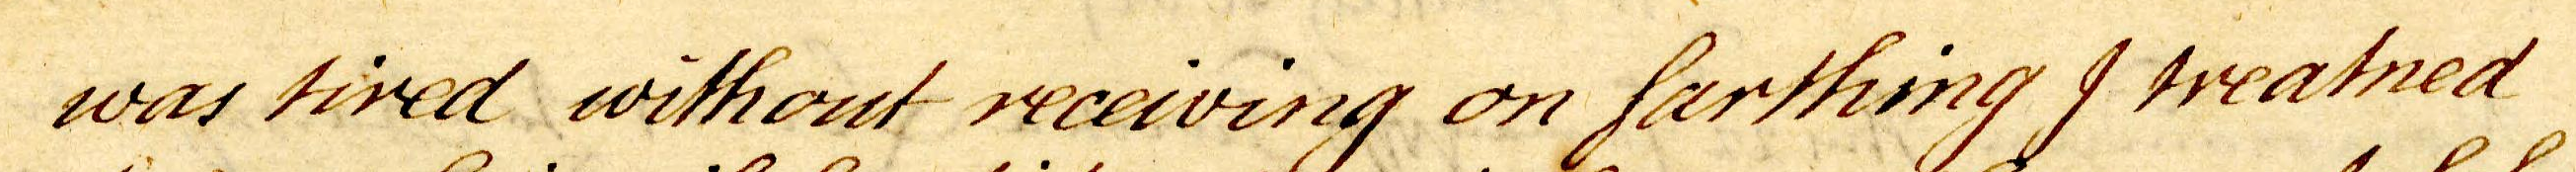was tired without receiving on farthing I treatned
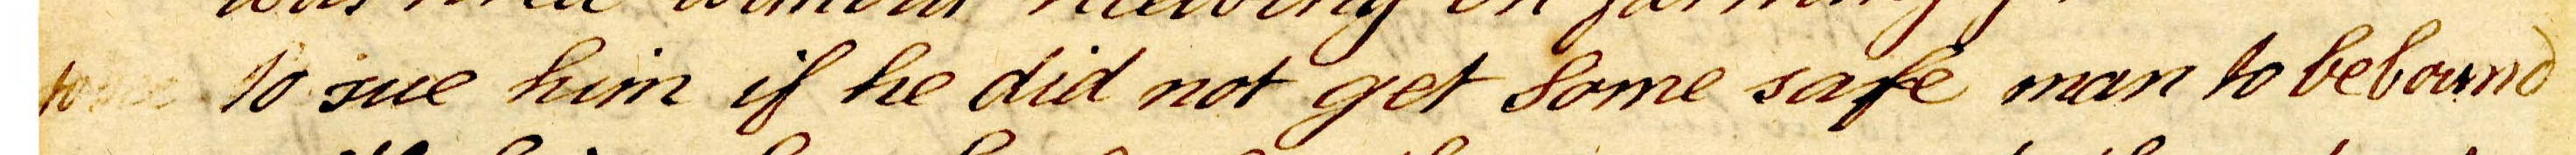to to sue him if he did not get Some safe man to be bound
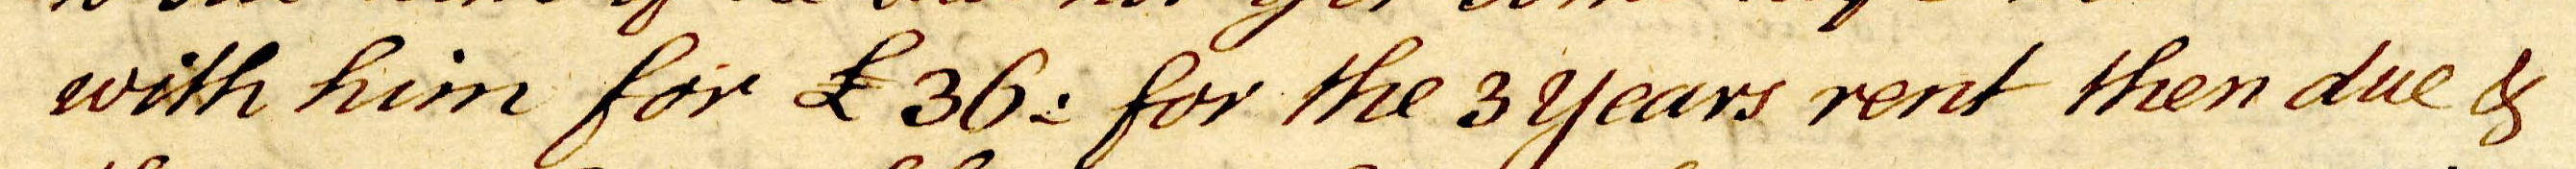with him for £36: for the 3 Years rent then due &
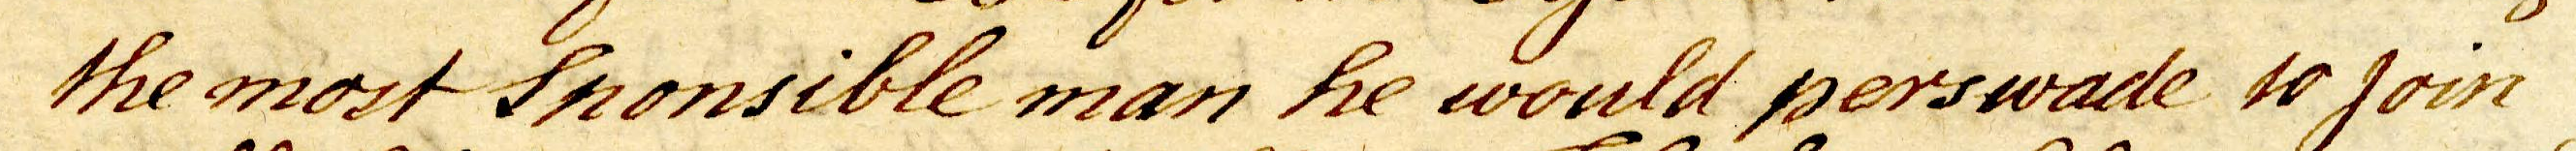the most Sponsible man he would perswade to Join
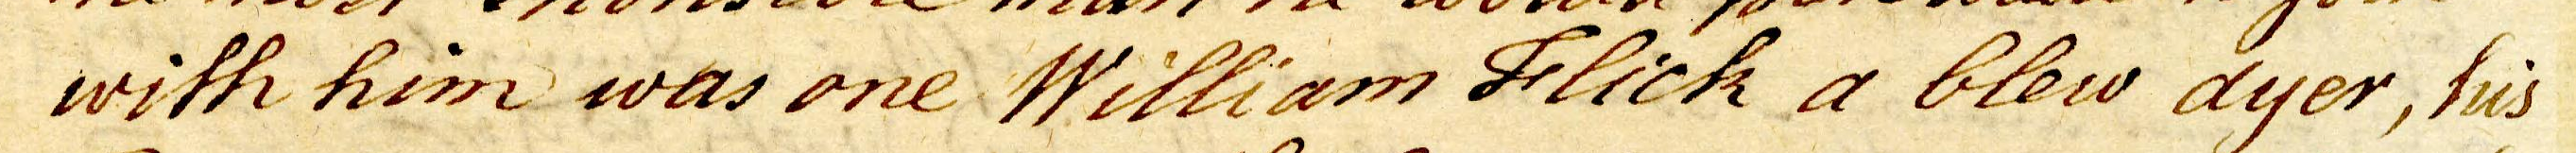with him was one William Flick a blew dyer, his
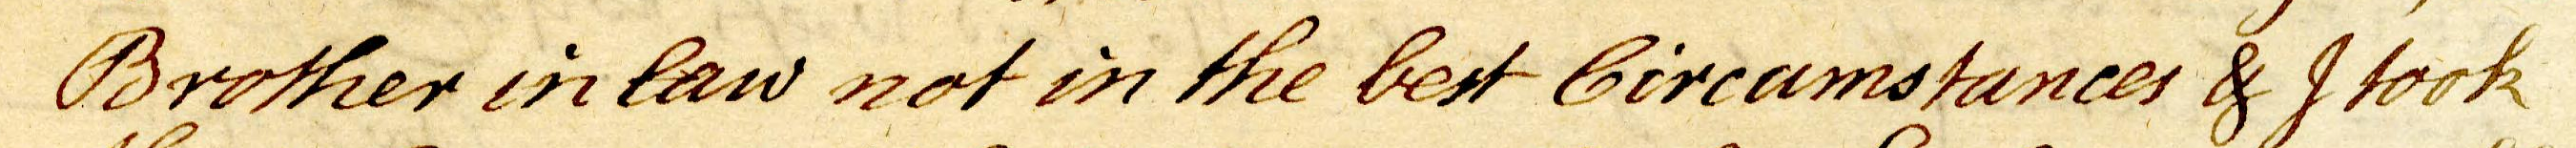Brother in law not in the best Circumstances & I took
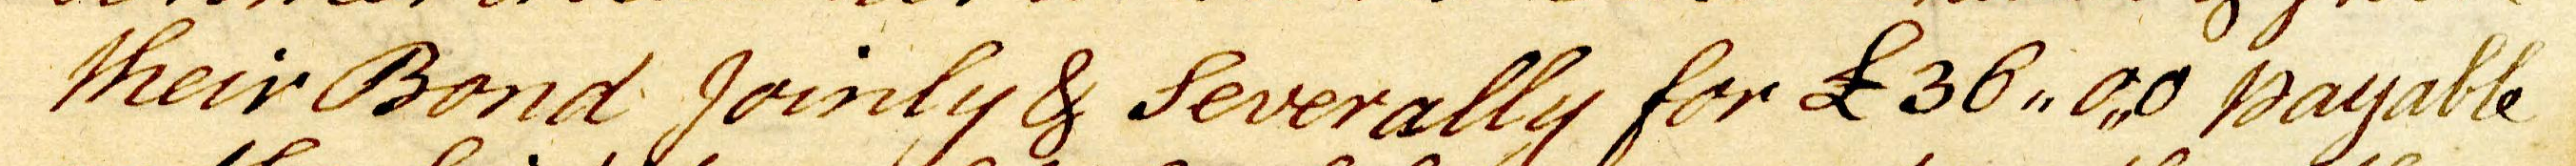their Bond Joinly & Severally for £36..0..0 payable
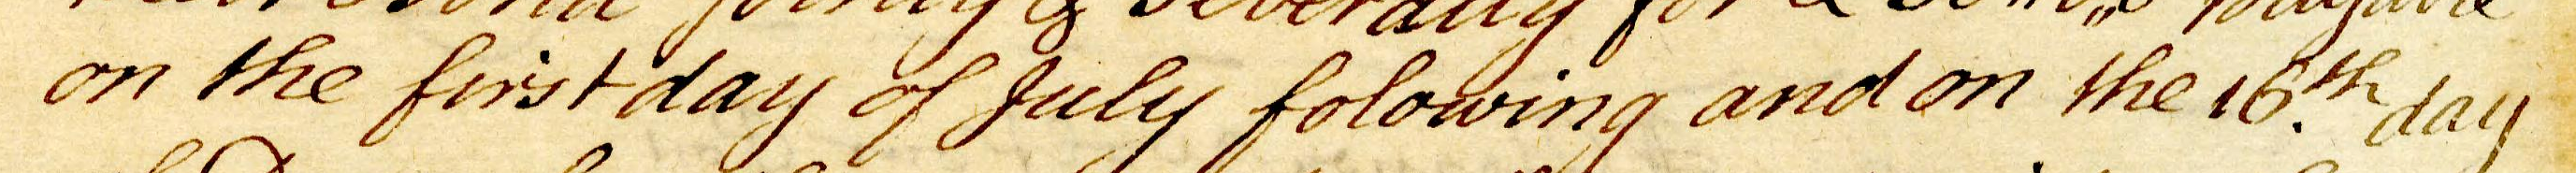on the first day of July folowing and on the 16^th. day
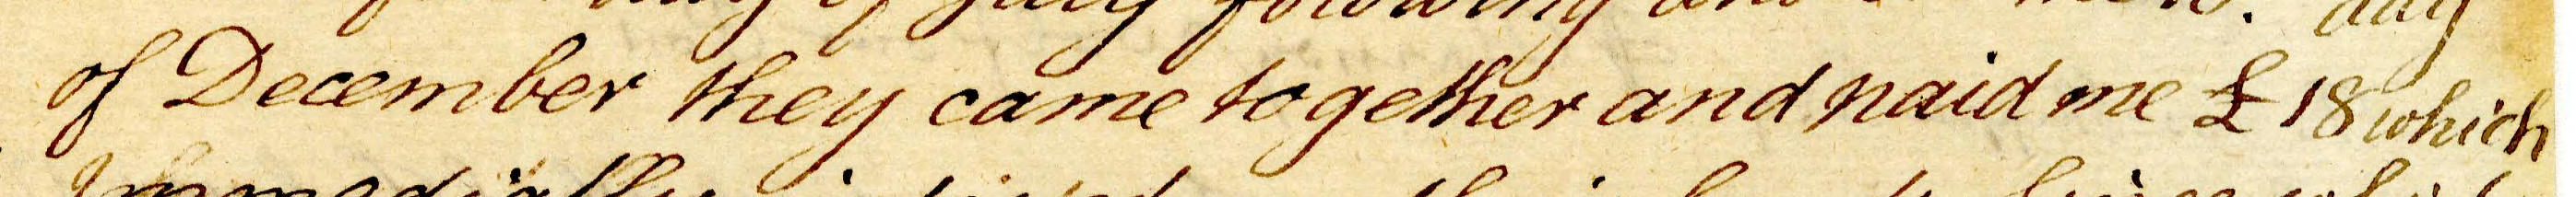of December they came together and paid me £18 which
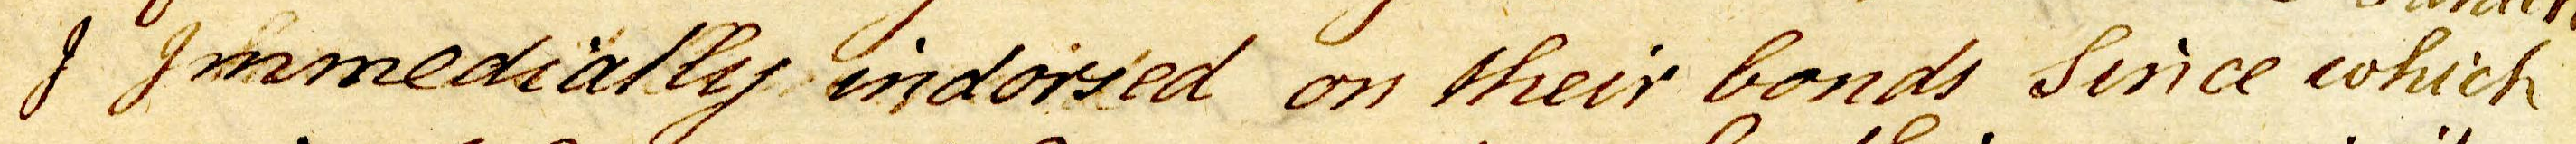I Immediatly indorsed on their bonds Since which
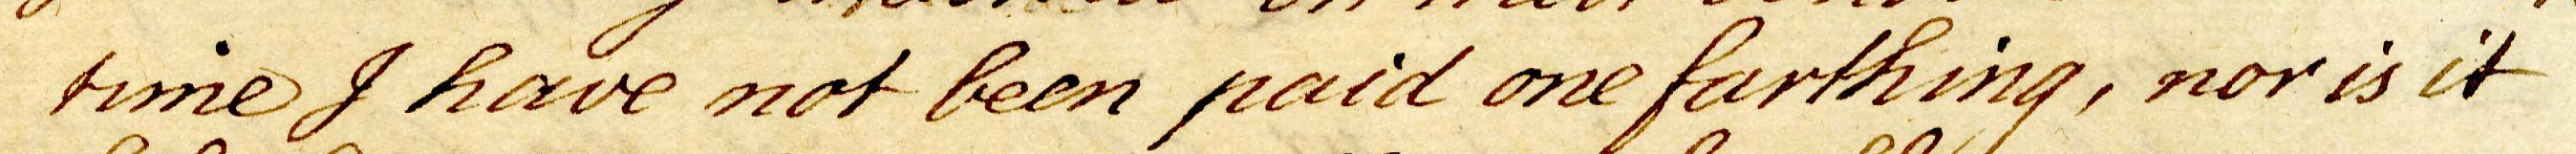time I have not been paid one farthing, nor is it
